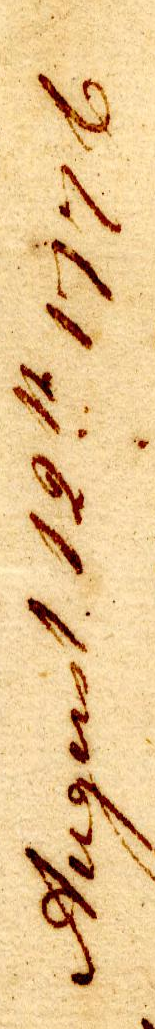August. 12^th. 1776
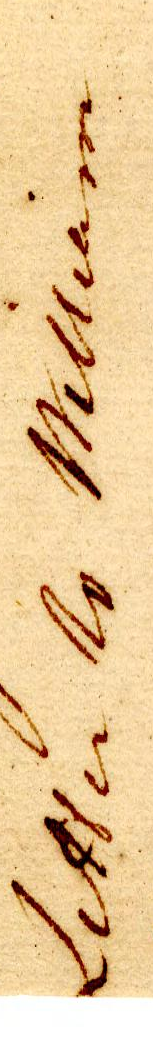Letter to William
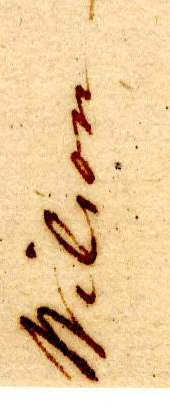Wilson
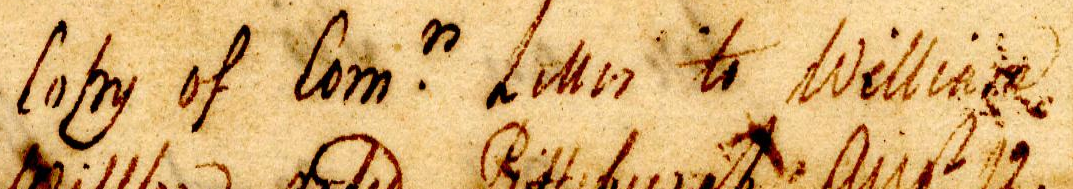Copy of Com^r. Letter to William
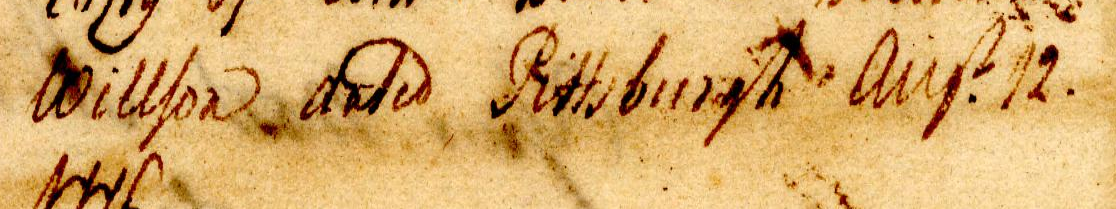Willson dated Pittsburgh Aug^t. 12.
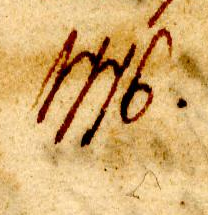1776.
